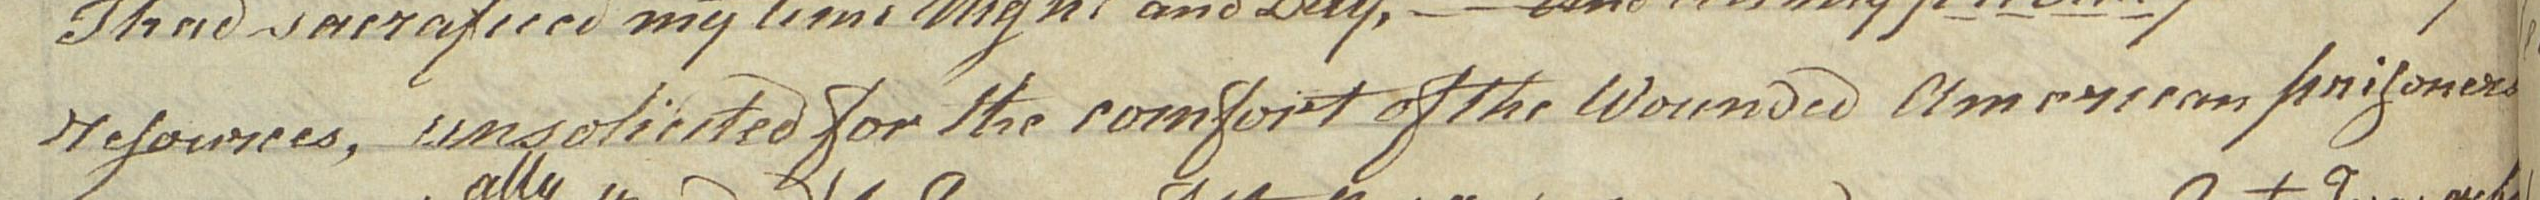resources, unsolicited for the comfort of the Wounded American prisoners
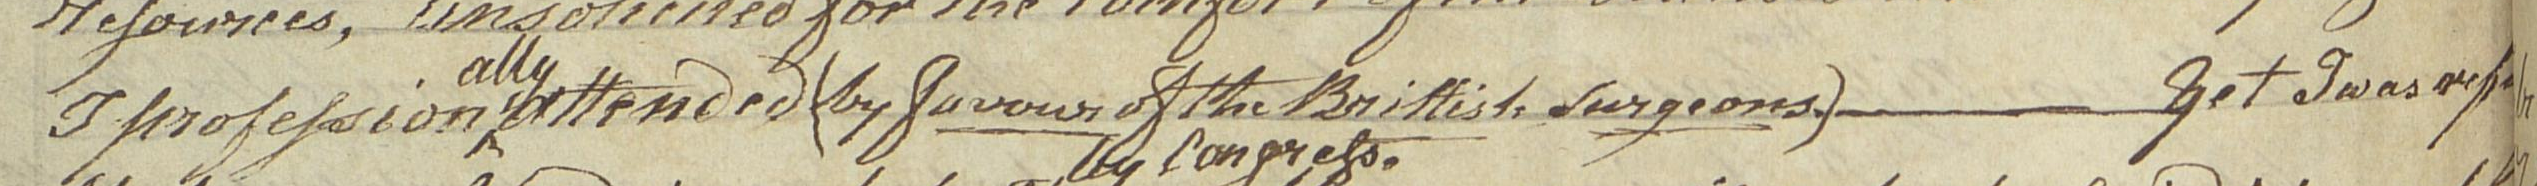I profession ^ attended (by favour of the Brittish Surgeons.) Yet I was rep-
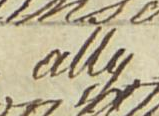ally
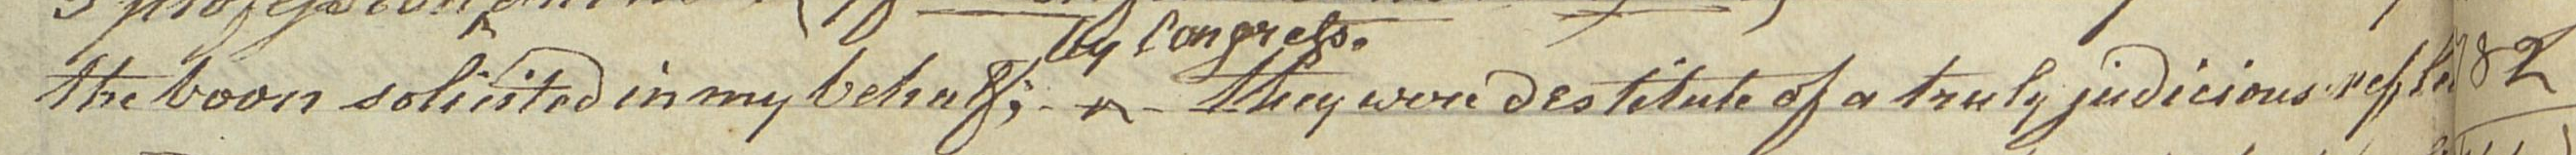the boon solicited in my behalf; ^ They were destitute of a truly judicious refl-
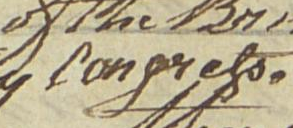Corgress
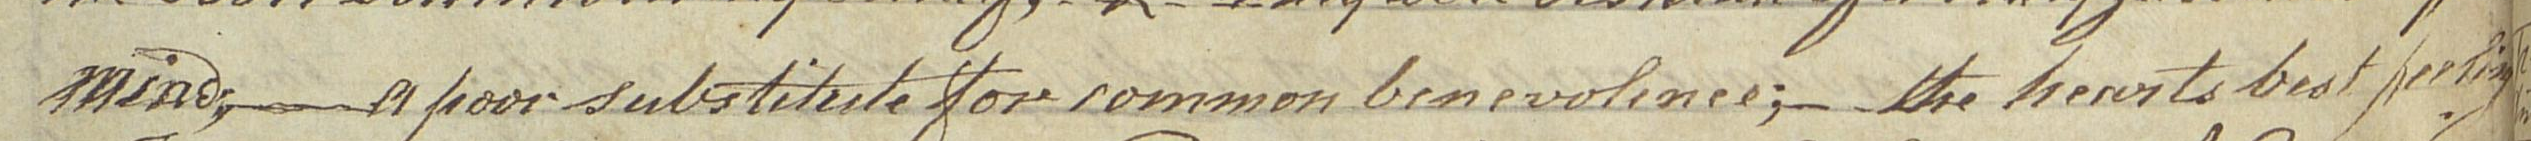mind; A poor substitute for common benevolence; the hearts best per-
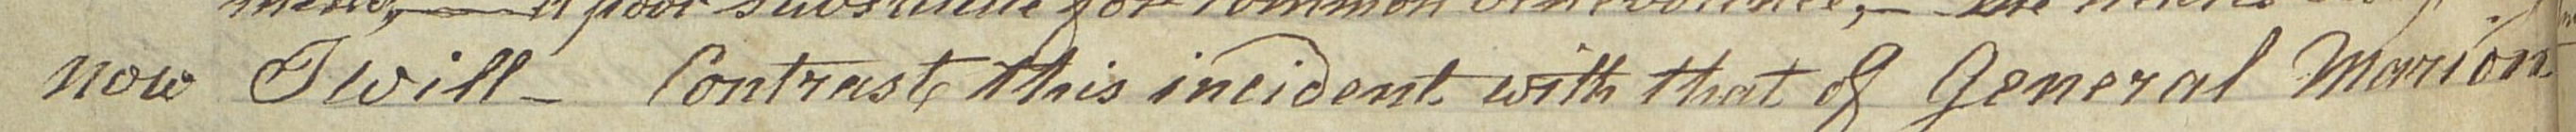now I will, Contrast this incident with that of general Marion
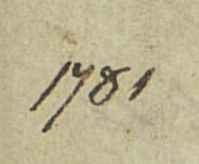1781
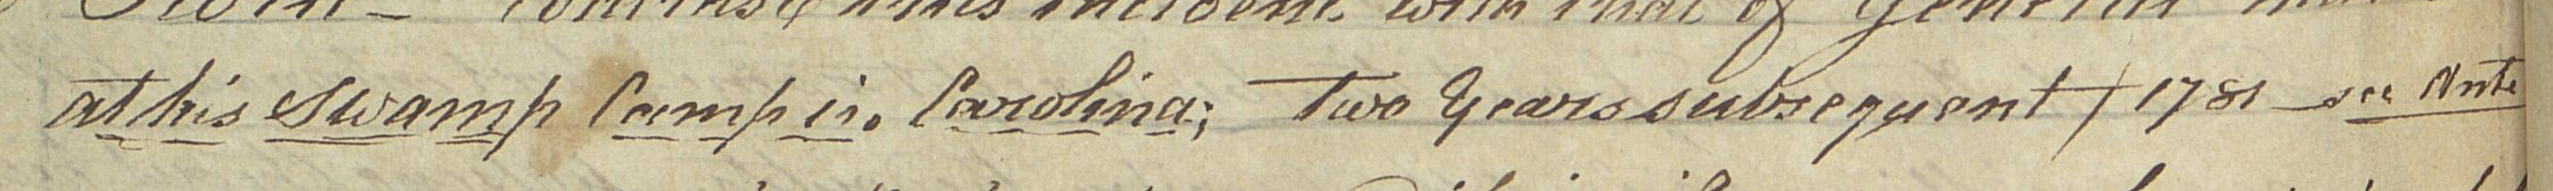at his Swamp Camp is Carolina; two years subsequent 1781 see Ante
